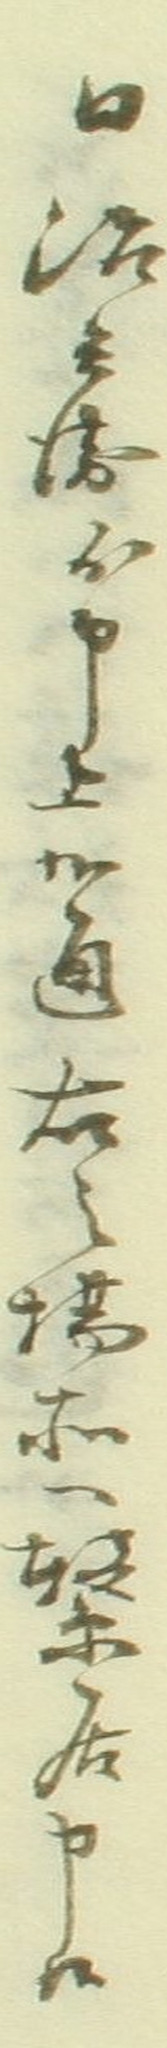日治兵衛ゟ申上御通右之場所へ繋居申候
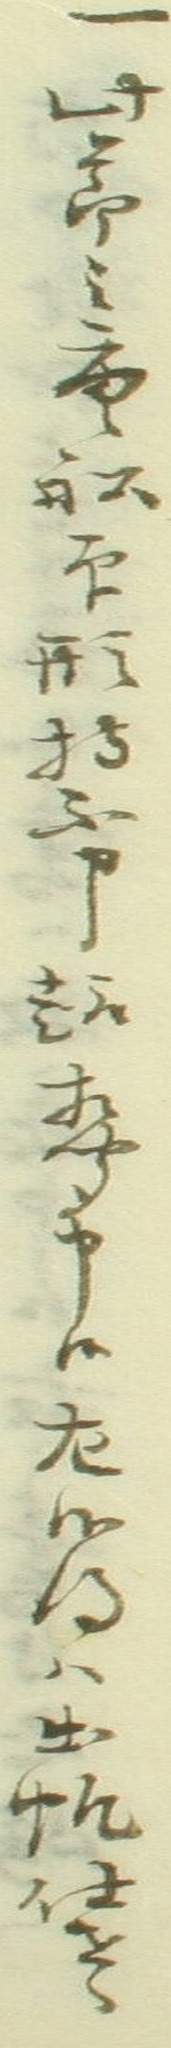一此節之唐船印形持不申候趣相聞申候左候得は出帆仕世々
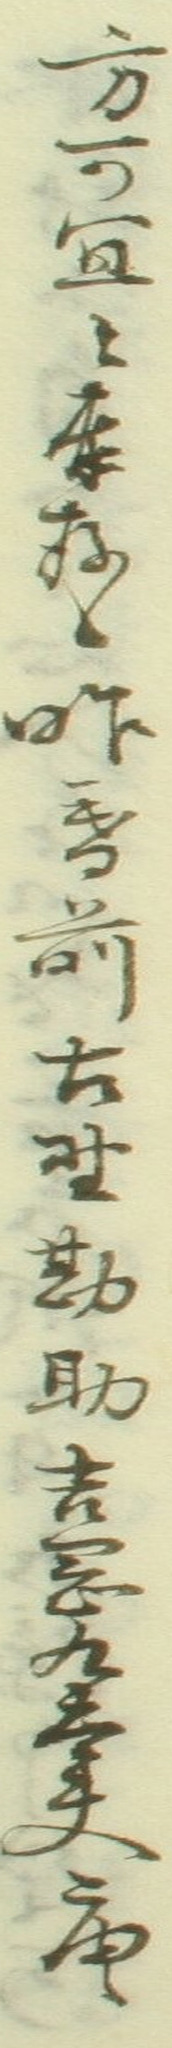方可宜と存候昨暮前古野勘助吉岡九太夫唐
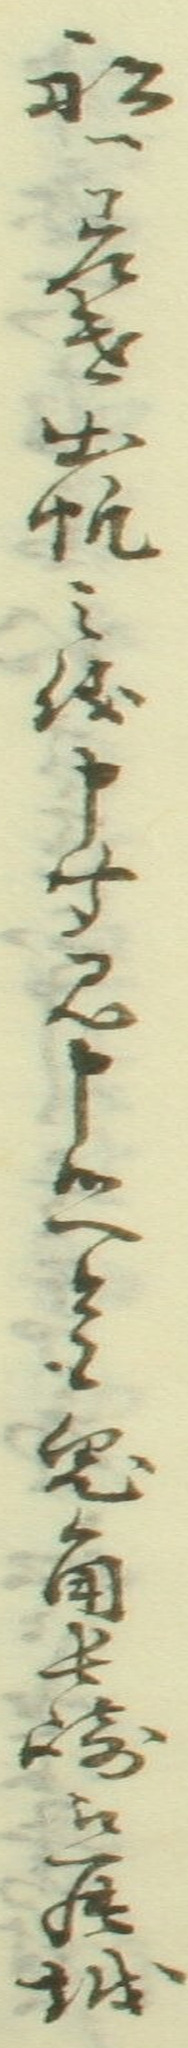船へ差遣出帆之儀申聞見申候へとも菟角長崎え罷越

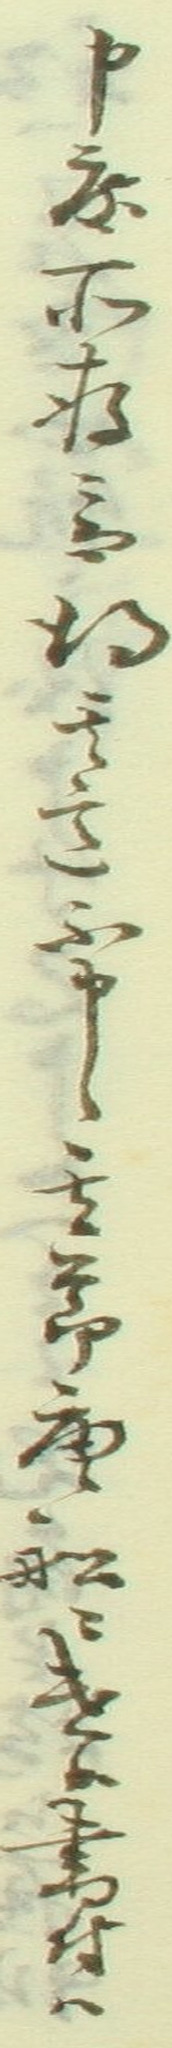申度所存に而得其意不申候其節唐船に遣候書付は
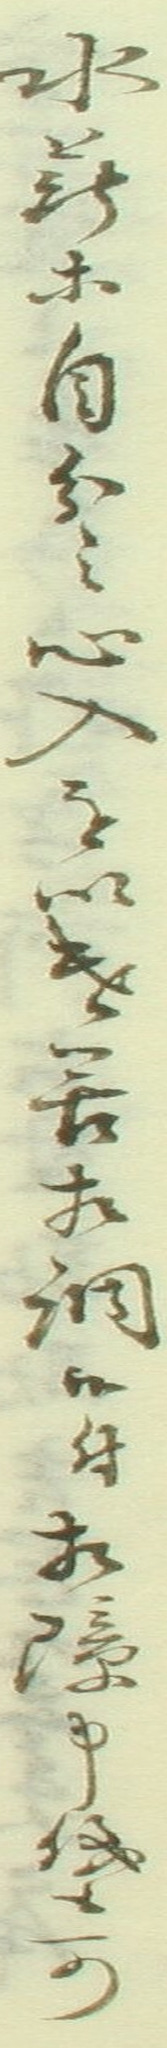水薪等自分之心入を以遣筈相調候付相障申儀も可
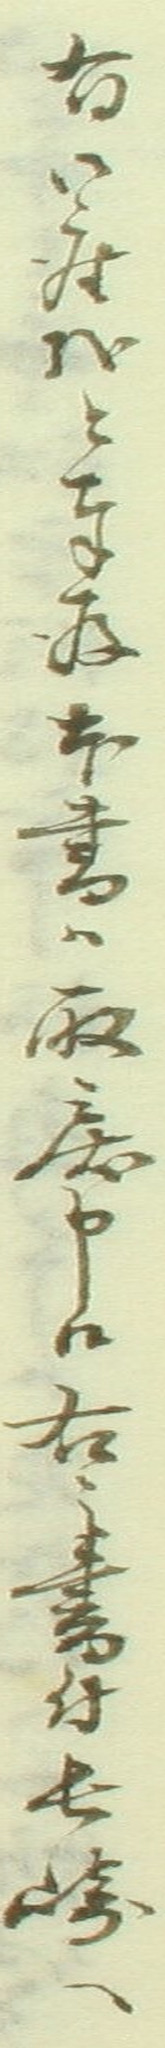有御座哉と奉存本書は取戻申候右之書付長崎へ
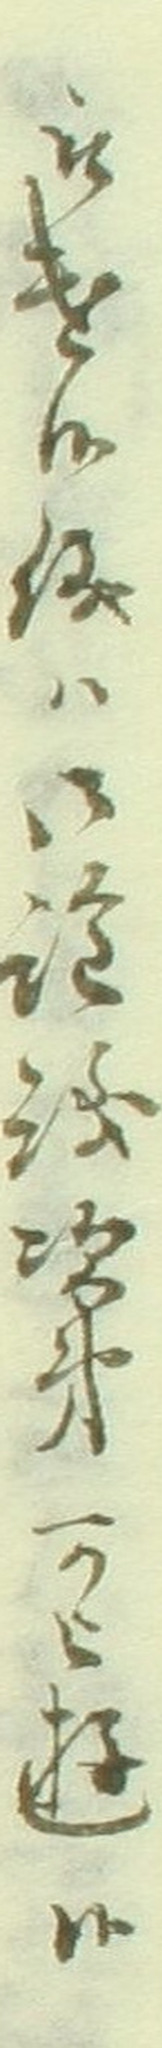被遣候儀は御詮議次第可被遊候
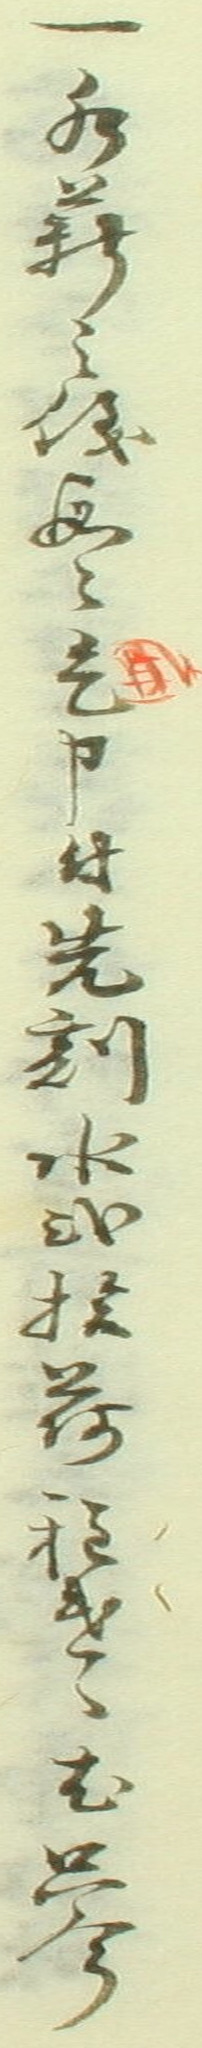一水薪之儀段々も申付先刻水弐拾荷程遣候尤只今
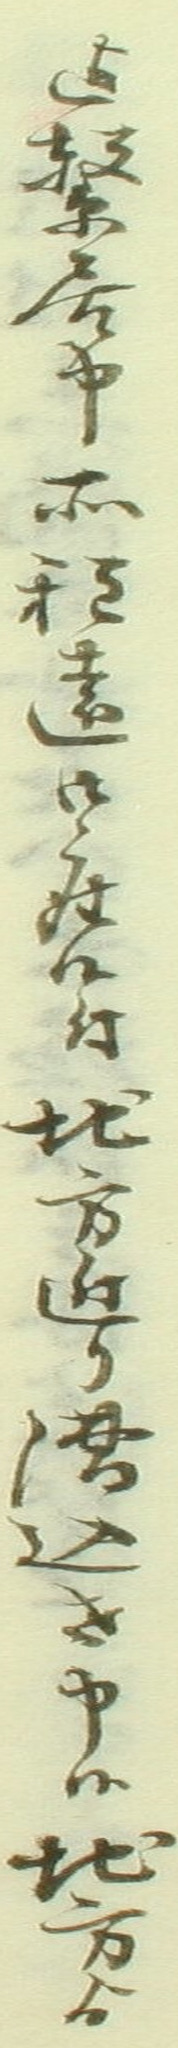迄繋居申所程遠御座候付地方近り漕込せ申候地方ゟ
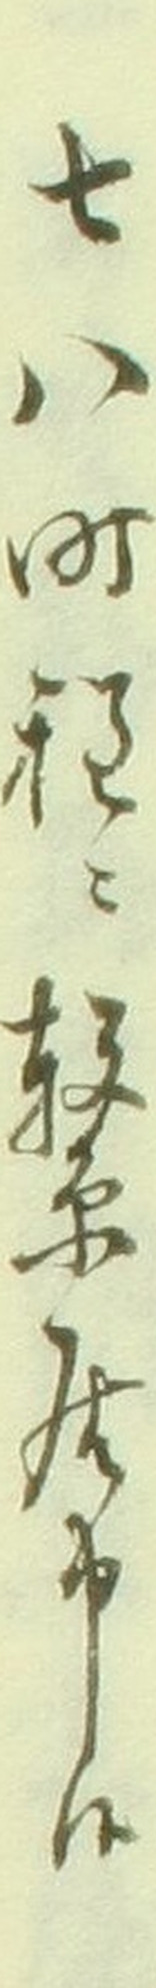七八町程に繋居申候
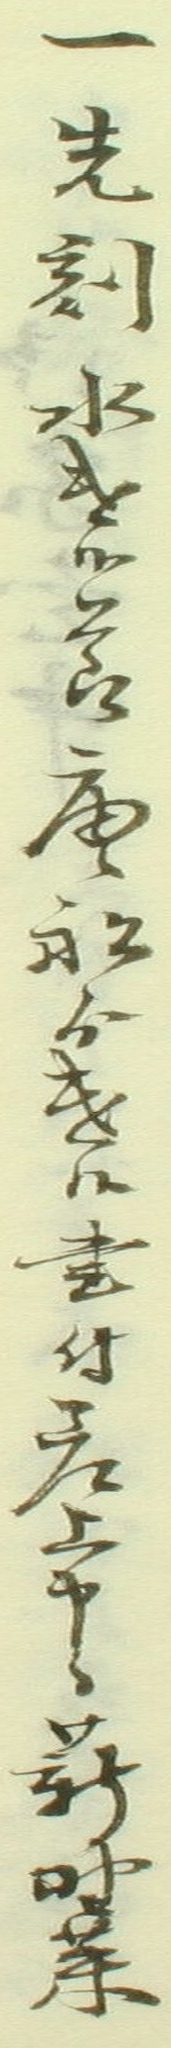一先刻水遣候節唐船ゟ遣候書付差上申候薪野菜
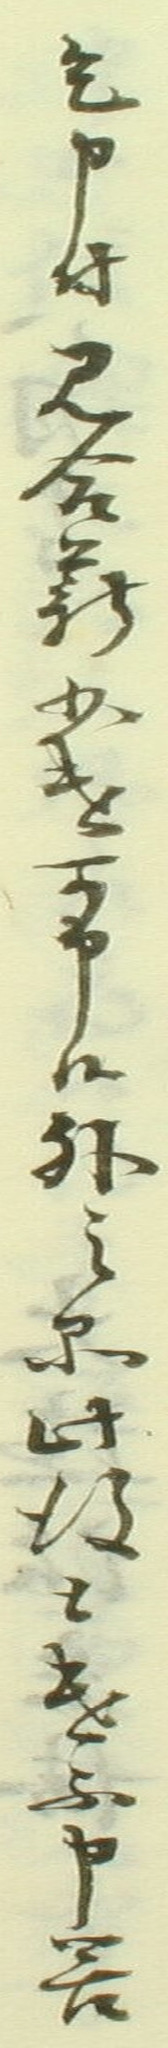も申付見合薪少遣可申候外之品此後も遣不申筈
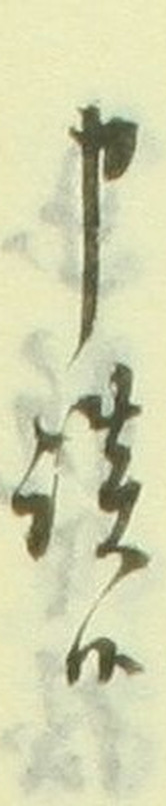申談候
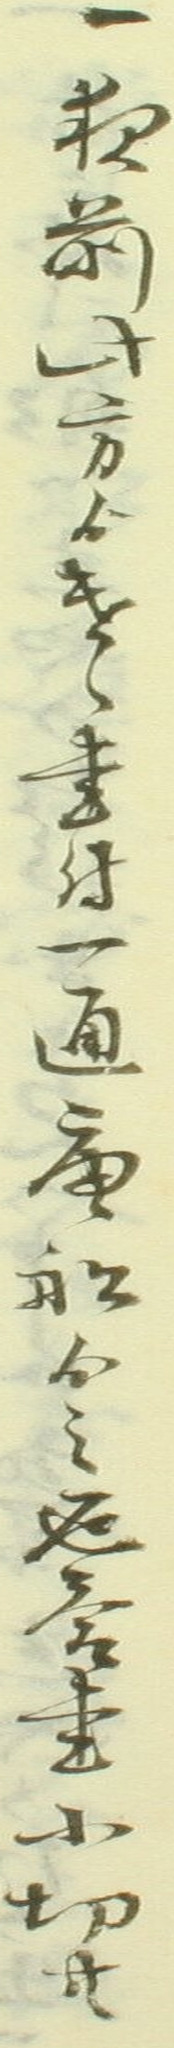一夜前此方ゟ遣候書付一通唐船ゟ之返答書小切共
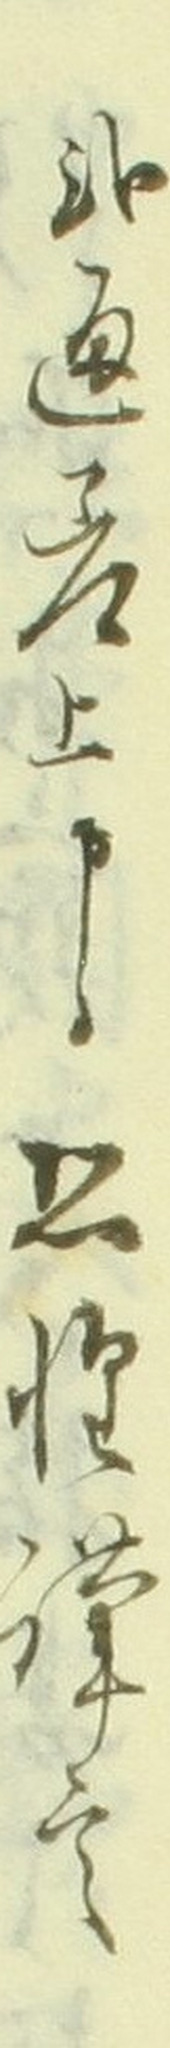弐通差上申候恐惶謹言
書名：異国船漂着記
